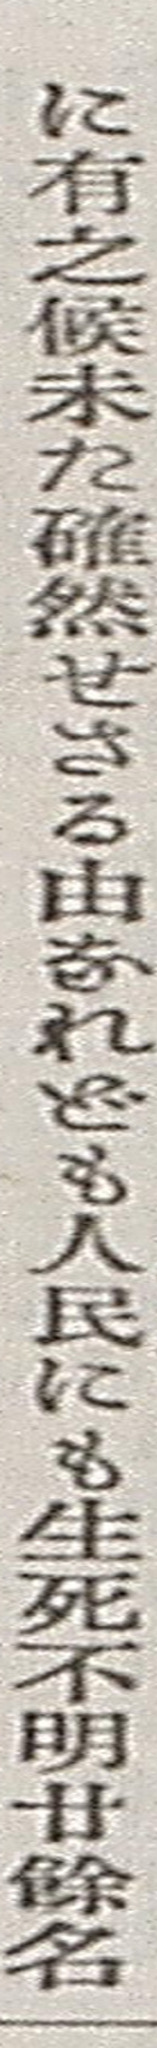に有之候未た確然ぜさる由なれども人民にも生死不明廿余名
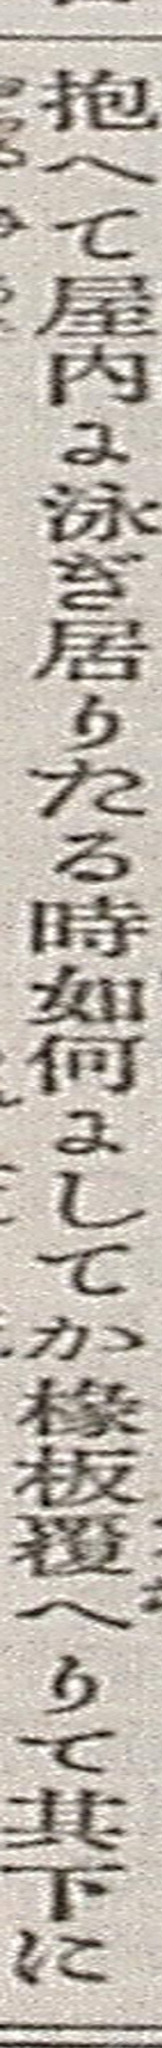抱へて屋内に泳ぎ居りたる時如何にしてか椽板覆へりて其下に
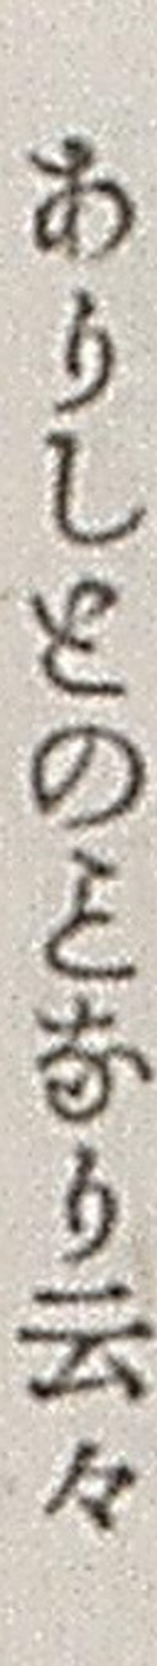ありしとのことなり云々
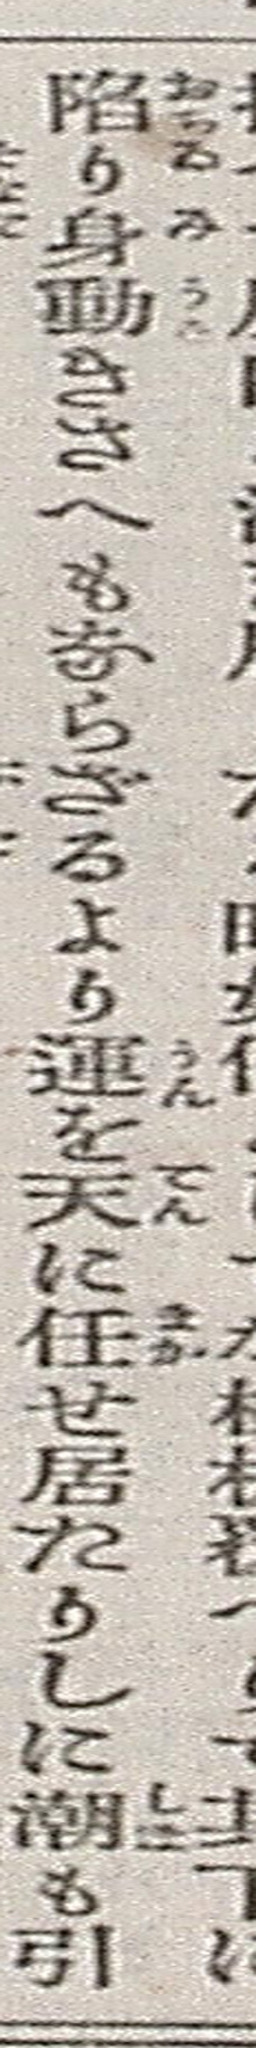陥り身動きさへもならざるより運を天に任せ居たりしに潮も引
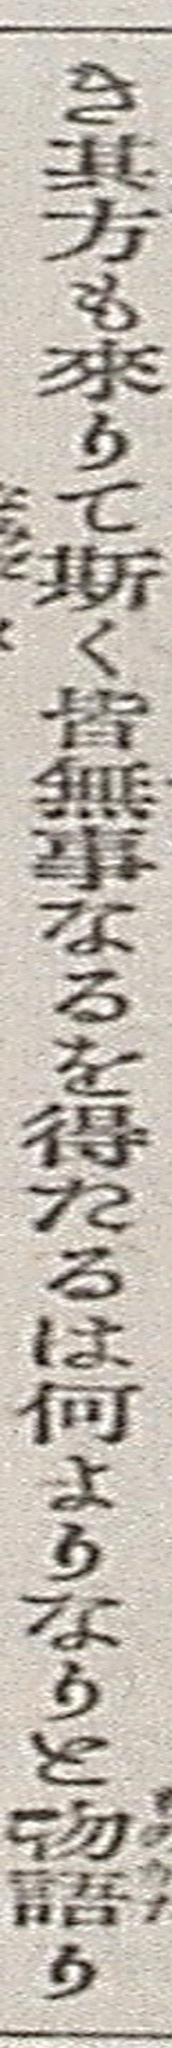き其方も来りて斯く皆無事なるを得たるは何よりなりと物語り
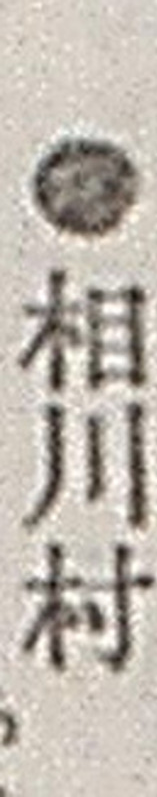●相川村
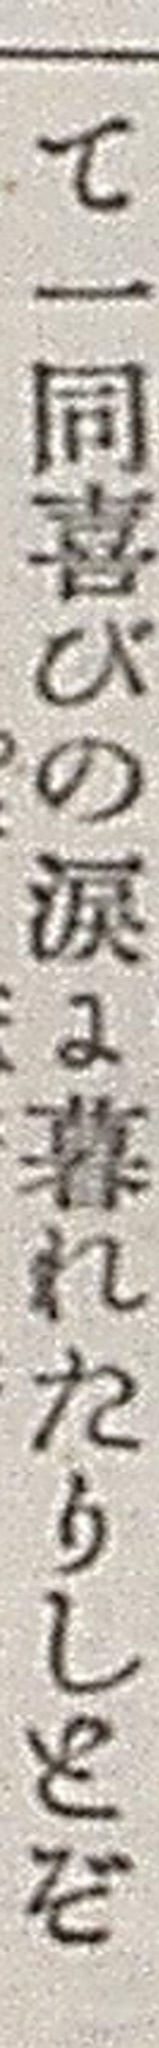て一同喜びの涙に暮れたりしとぞ
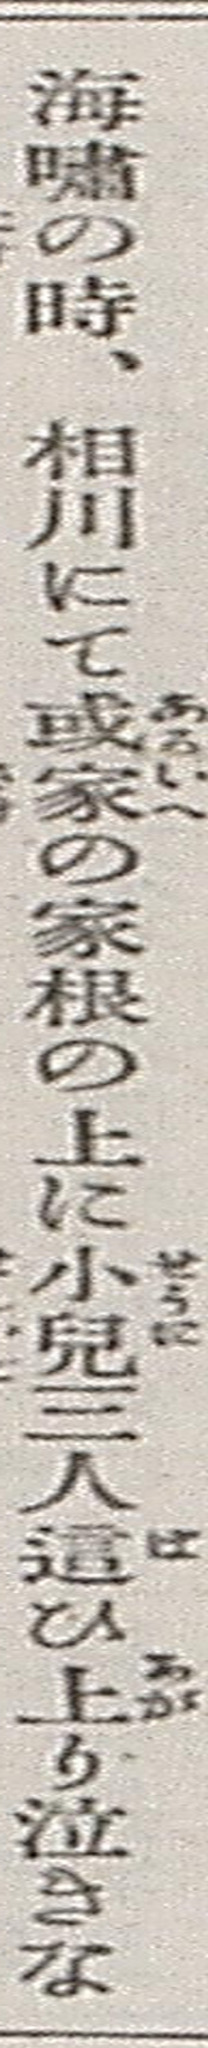海嘯の時、相川にて或家の家根の上に小児三人這ひ上り泣きな
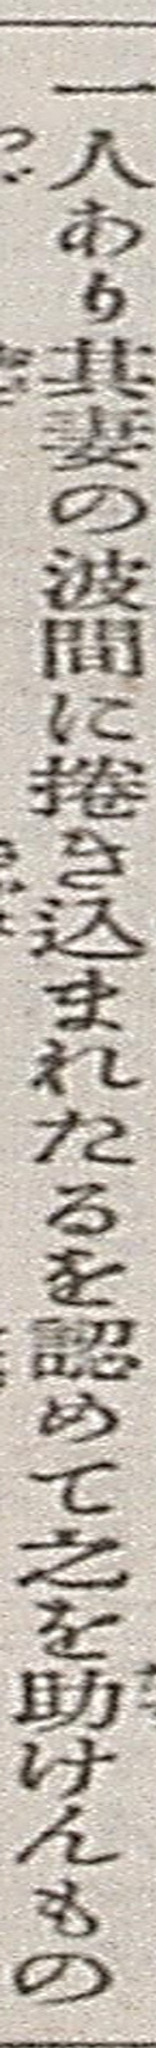一人あり其妻の波間に捲き込まれたるを認めて之を助けんもの
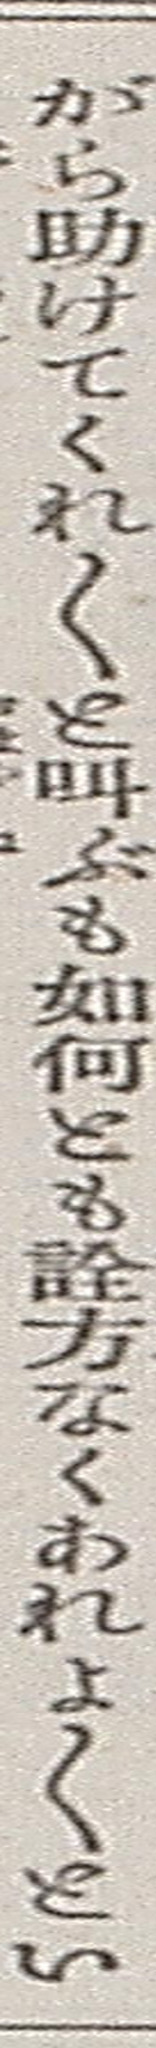がら助けてくれ〳〵と叫ぶも如何とも詮方なくあれよ〳〵とい
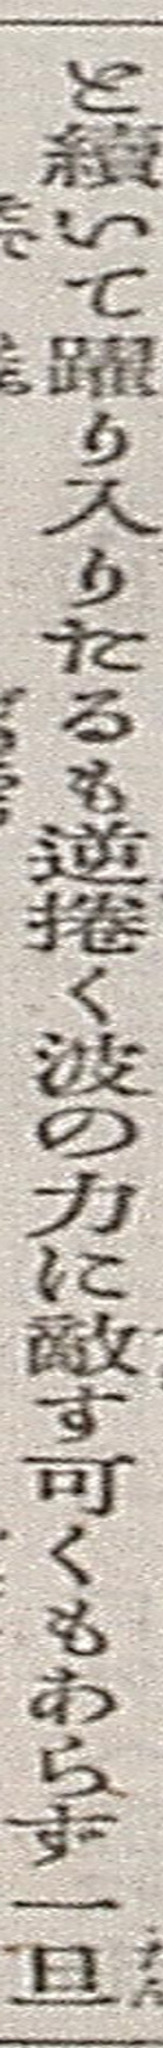と続いて躍り入りたるも逆捲く波の力に敵す可くもあらず一旦
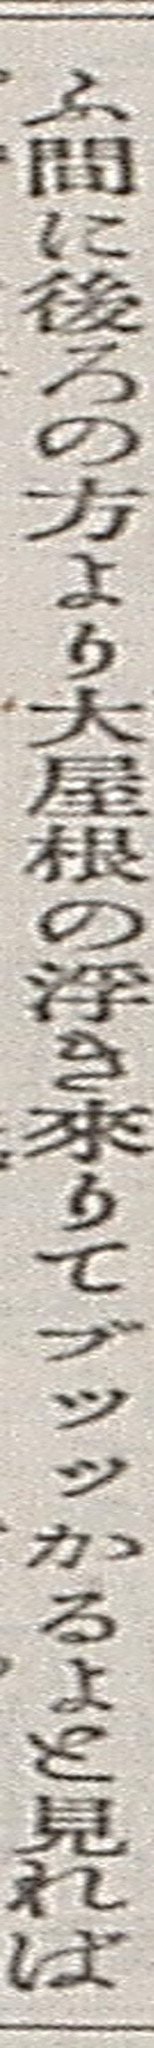ふ間に後ろの方より大屋根の浮き来りてブツッかるよと見れば
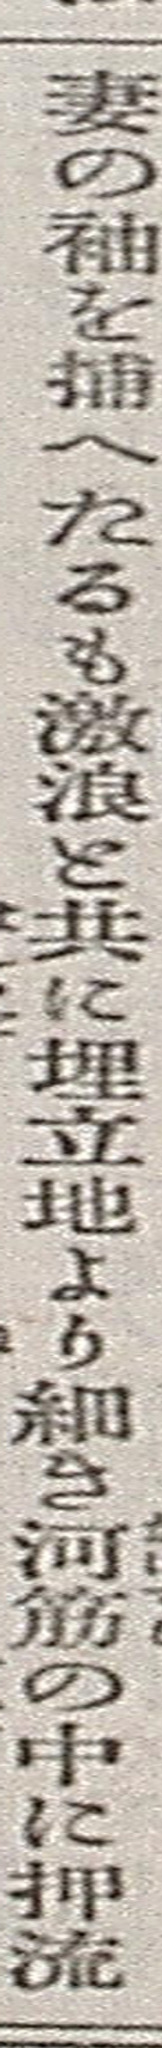妻の袖を捕へたるも激浪と共に埋立地より細き河筋の中に押流
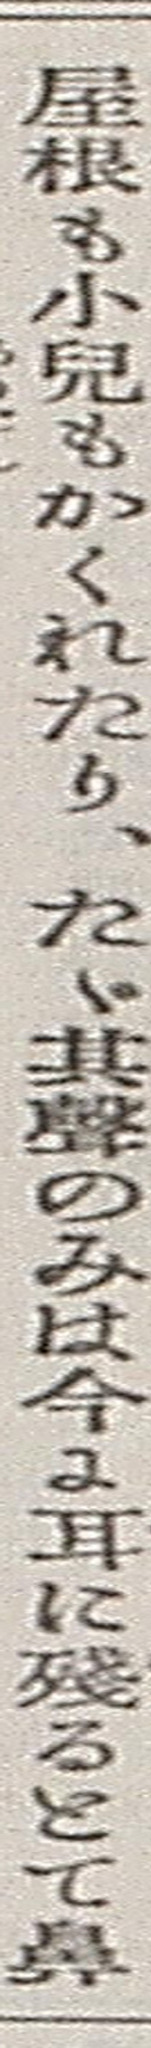屋根も小児もかくれたり、たゞ其声のみは今に耳に残るとて鼻
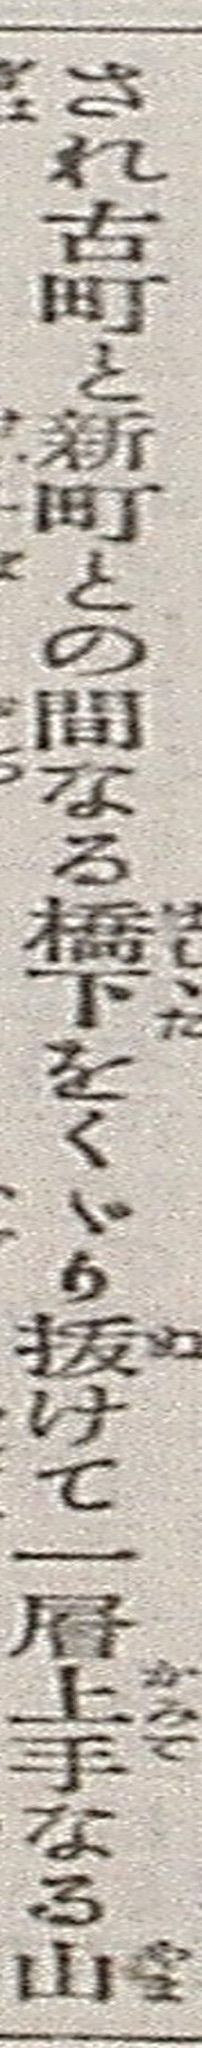され古町と新町との間なる橋下をくゞり抜けて一層上手なる山
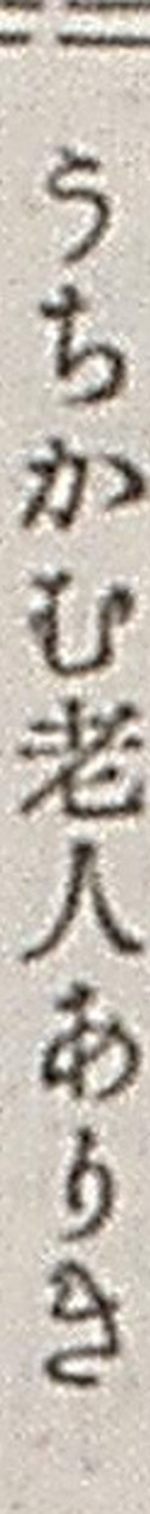うちかむ老人ありき
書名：風俗畫報臨時増刊第百十九號　大海嘯被害録（中）
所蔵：東京大学地震研究所図書室 Earthquake Research Institute Library, The University of Tokyo, JAPAN
